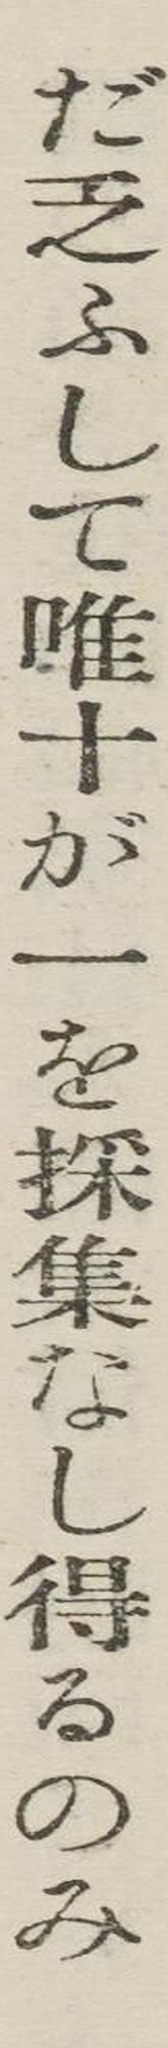だ乏ふして唯十が一を採集なし得るのみ
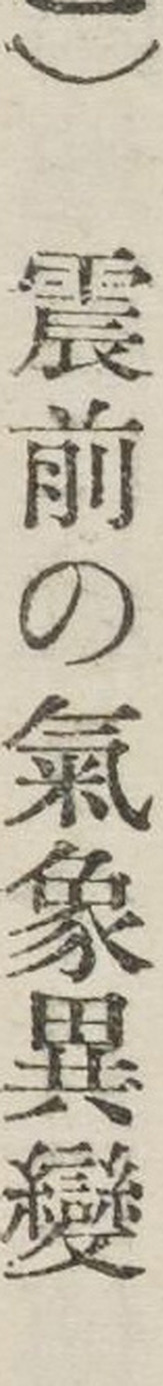震前の気象異変

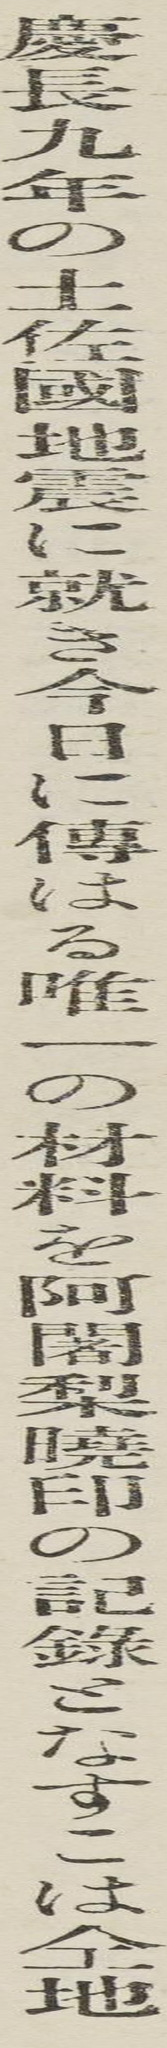慶長九年の土佐国地震に就き今日に伝はる唯一の材料を阿闍梨暁印の記録となすこは同地
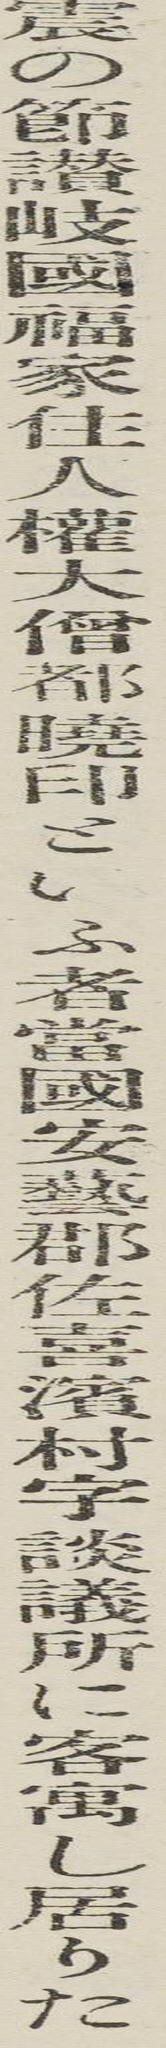震の節讃岐国福家住人権大僧都暁印といふ者当国安芸郡佐喜浜村字談議所に客寓し居りた
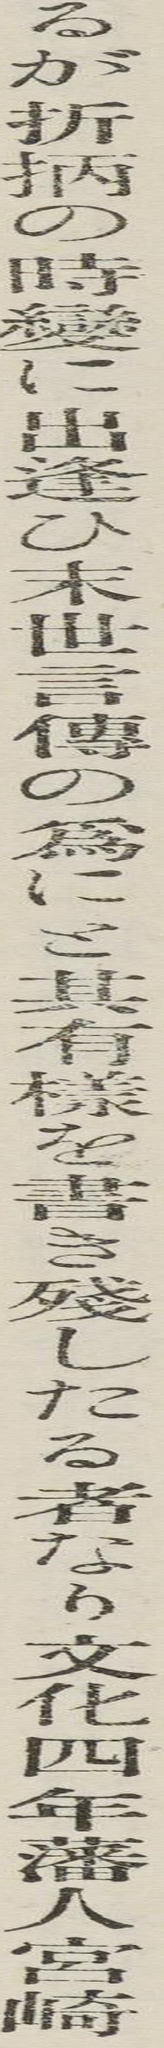るが折柄の時変に出逢ひ末世言伝の為にと其有様を書き残したる者なり文化四年藩人宮崎
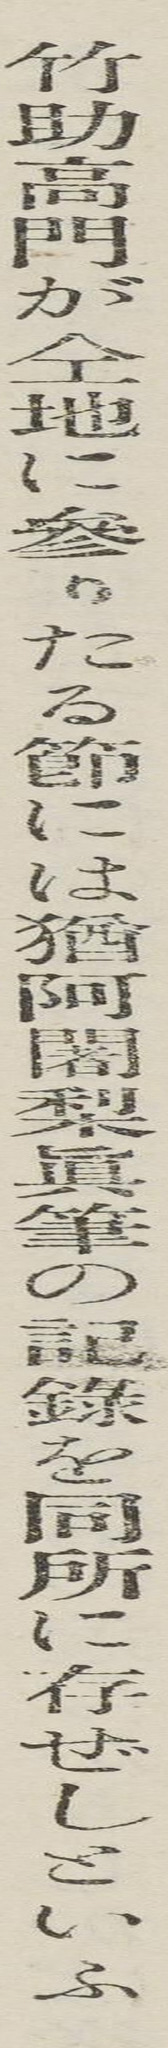竹助高門が同地に参りたる節には猶阿闍梨真筆の記録を同所に存ぜしといふ
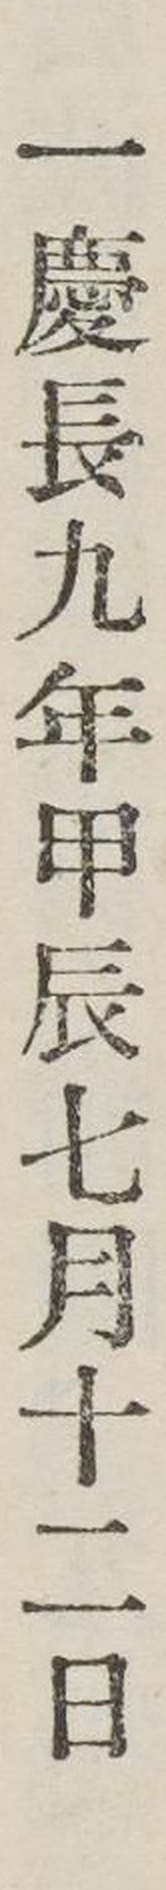㈠慶長九年甲辰七月十二日
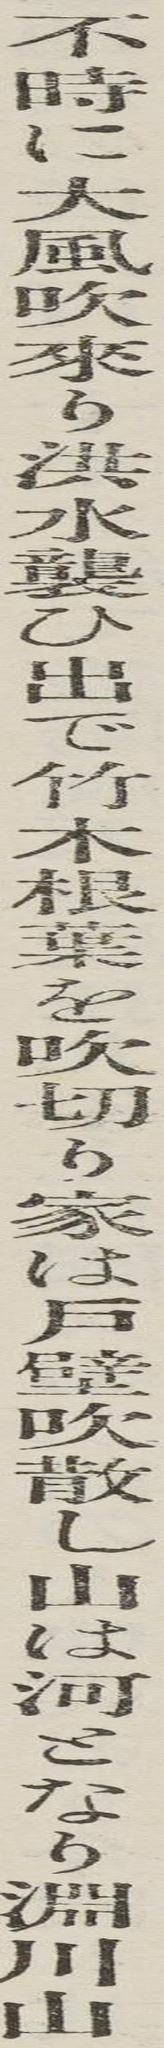不時に大風吹来り洪水襲ひ出で竹木根葉を吹切り家は戸壁吹散し山は河となり淵川山
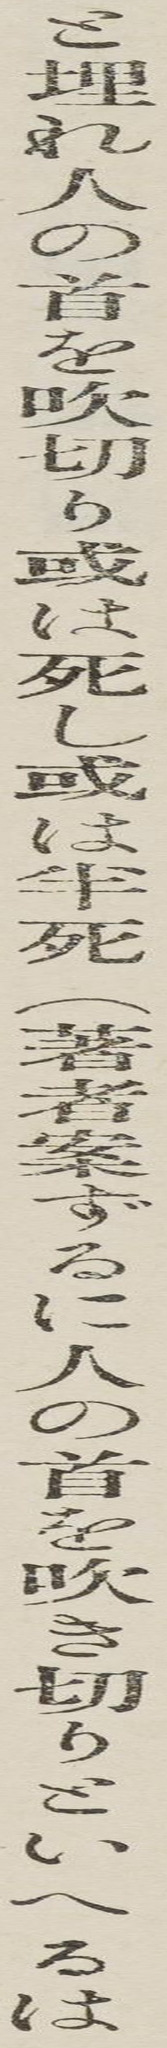と埋れ人の首を吹切り或は死し或は半死（著者案ずるに人の首を吹き切りといへるは
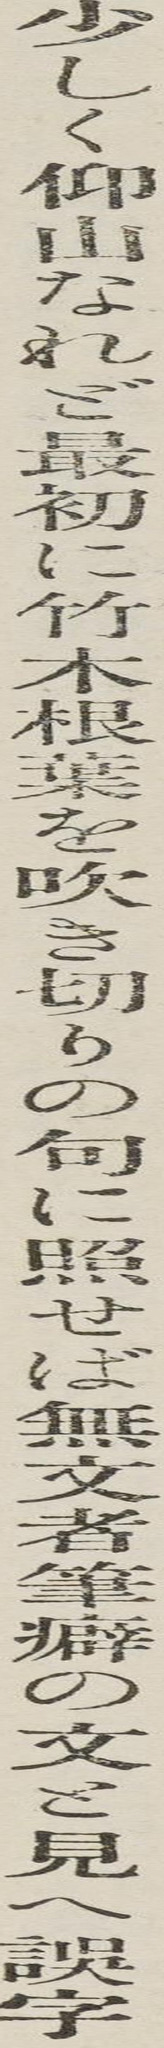少しく仰山なれど最初に竹木根葉を吹き切りの句に照せば無文者筆癖の文と見へ誤字
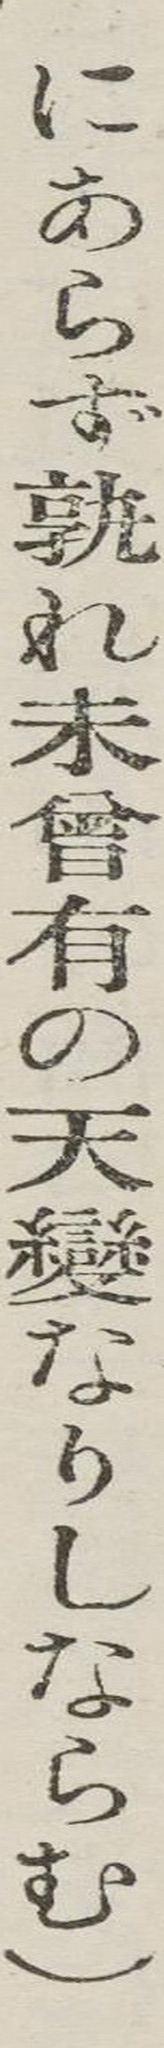にあらず孰れ未曾有の天変なりしならむ）
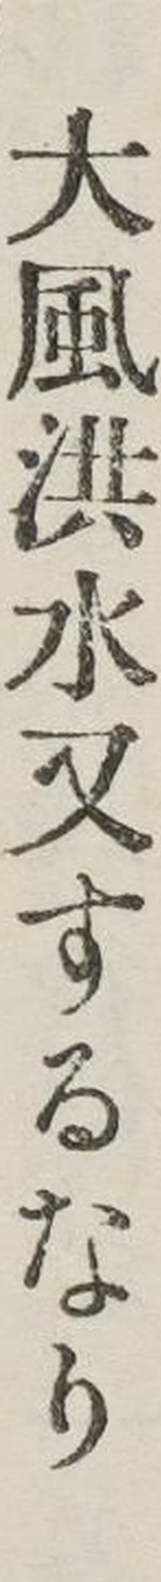大風洪水又するなり
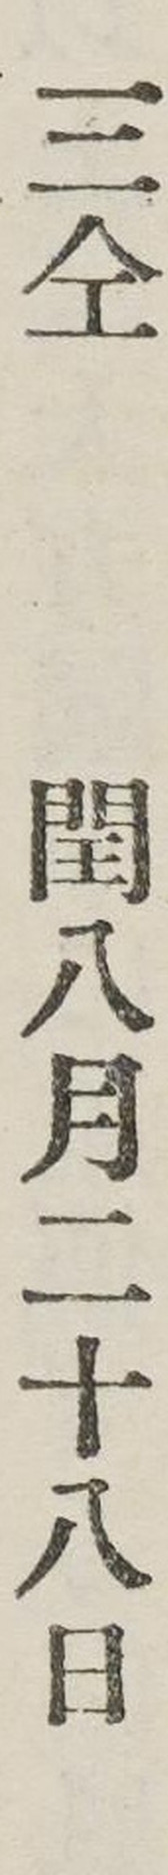㈢同閏八月二十八日
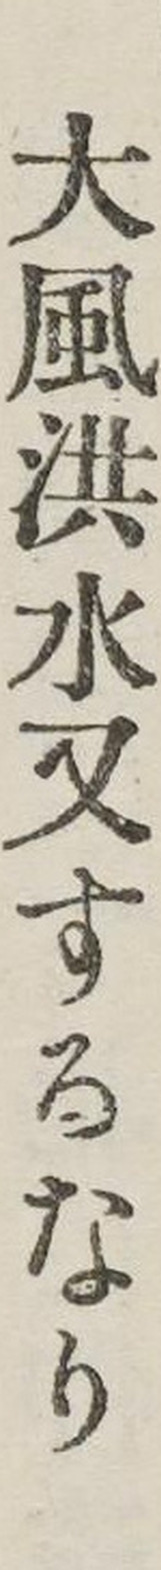大風洪水又するなり
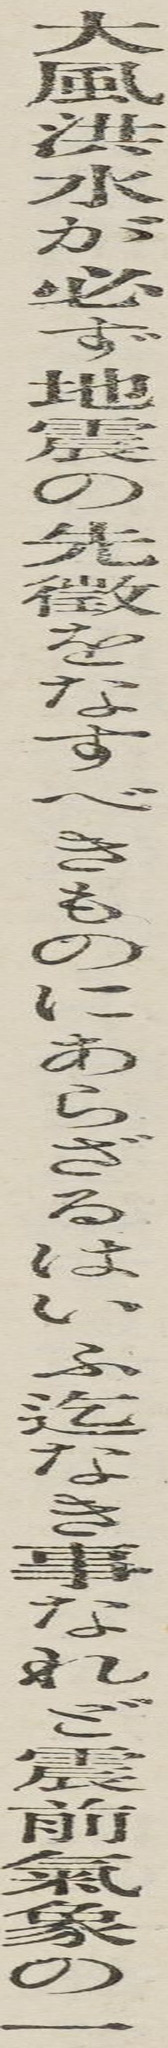大風洪水が必ず地震の先徴をなすべきものにあらざるはいふ迄なき事なれど震前気象の一
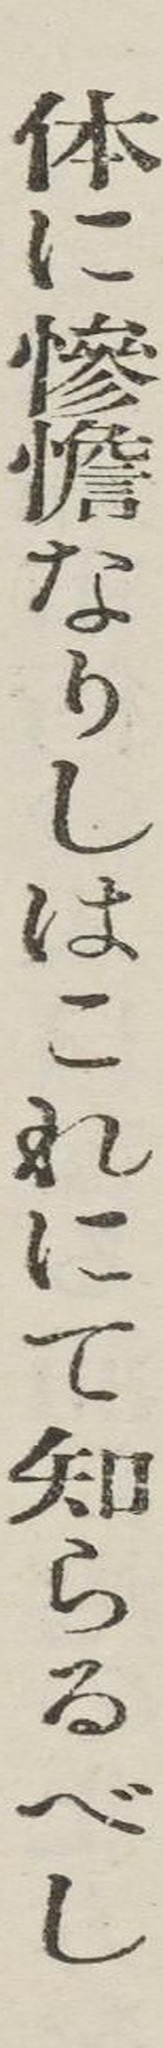体に惨憺なりしはこれにて知らるべし
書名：土佐古今ノ地震
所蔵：東京大学地震研究所図書室 Earthquake Research Institute Library, The University of Tokyo, JAPAN
